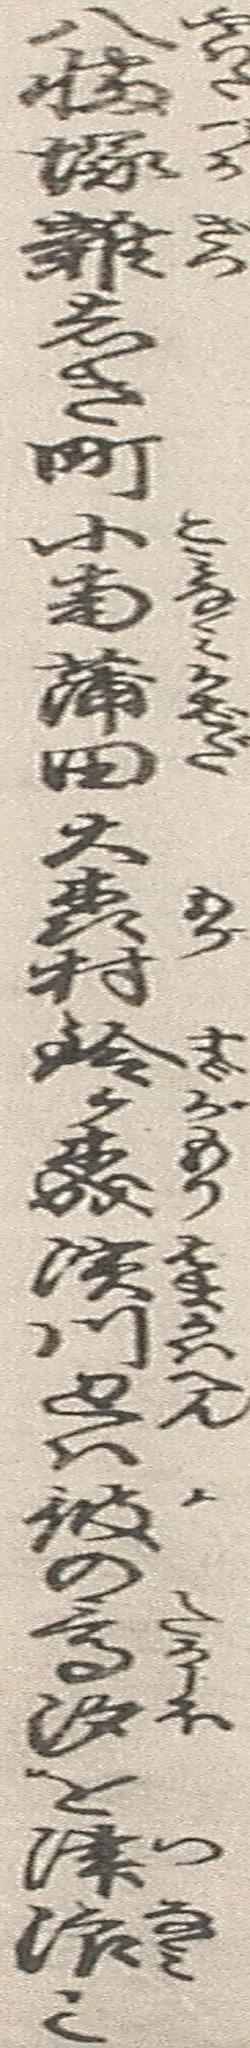八幡塚雑しき町小南蒲田大森村鈴ヶ森浜川辺ハ彼の高汐を津浪之
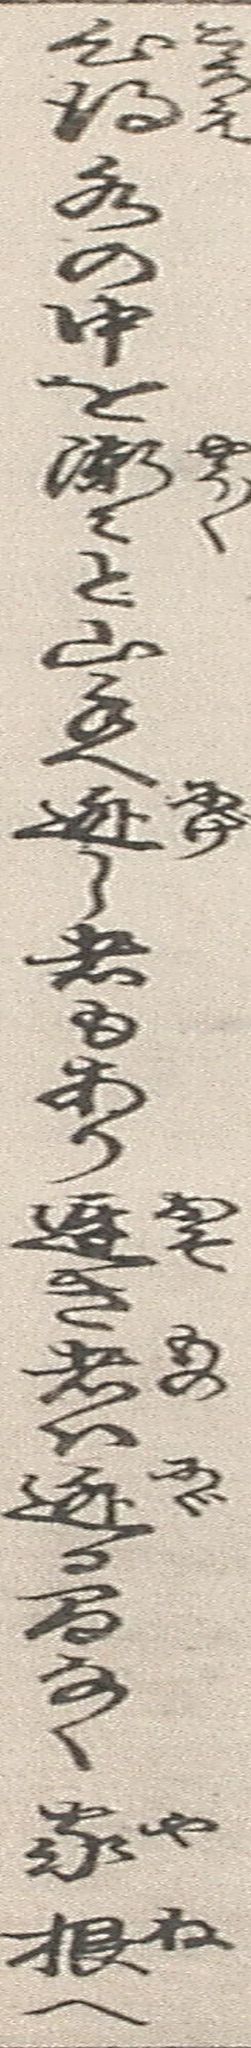心得水の中を漸々と山手へ逃し者もあり遅き者ハ逃る間なく屋根へ
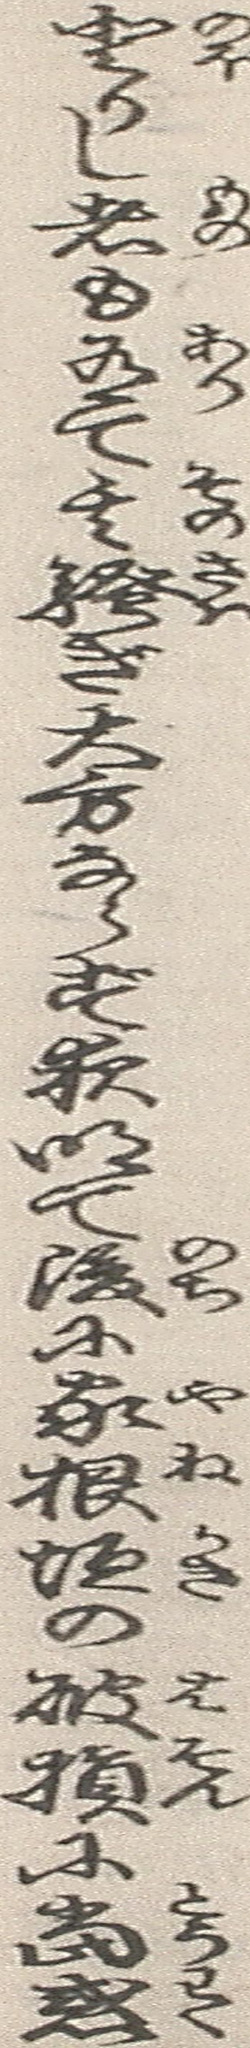登りし者も有て其騒ぎ大方ならず夜明て後に屋根垣の破損に当惑
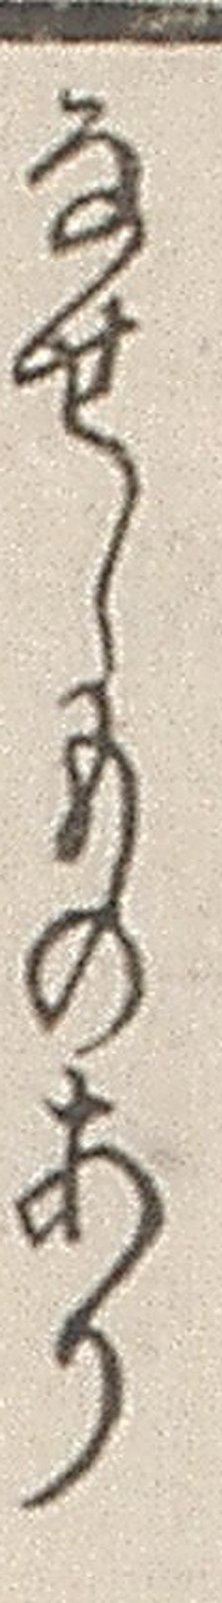なせるものあり
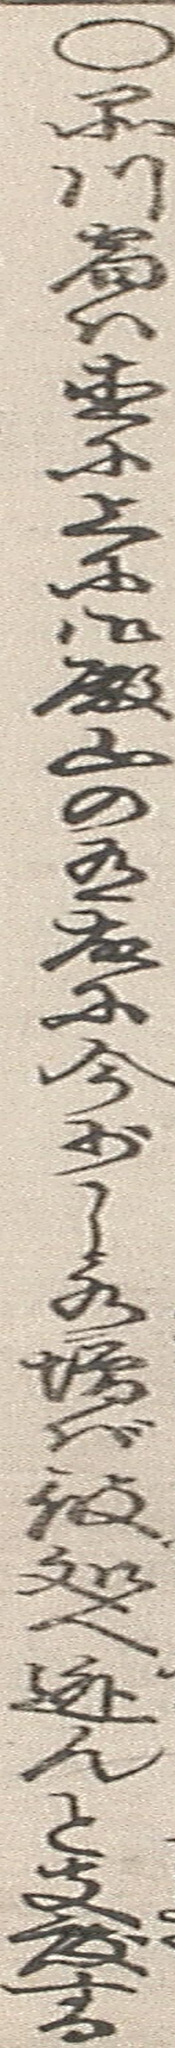◯品川宿ハ直に上に御殿山の有故に今少し水増バ彼処へ逃んと支度する
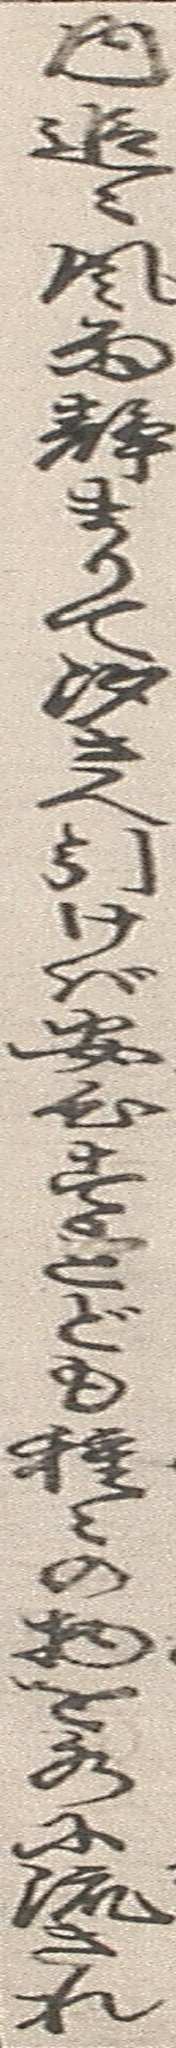内追々風雨静まりて汐さへ引けバ安心すれども種々の物を水に流され
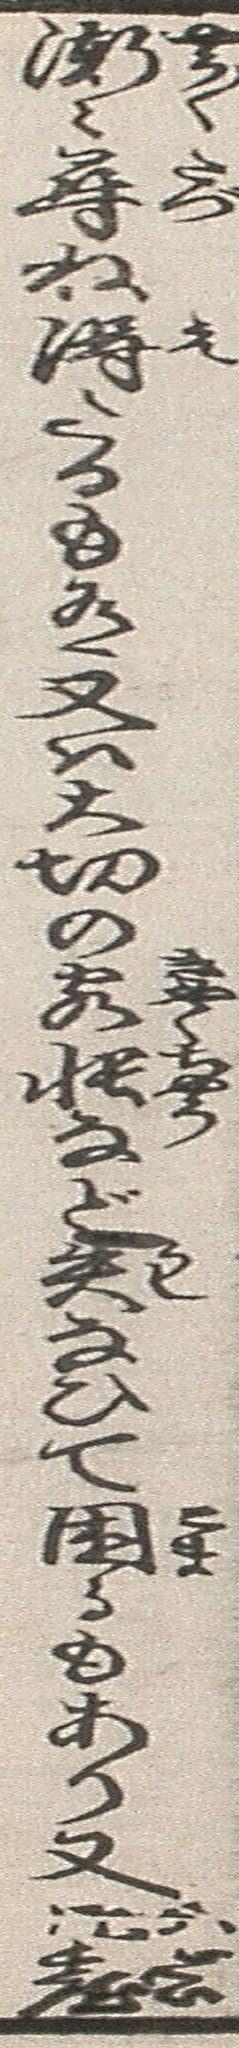漸々尋ね得たるも有又ハ大切の客帳など失なひて困るもあり又御台
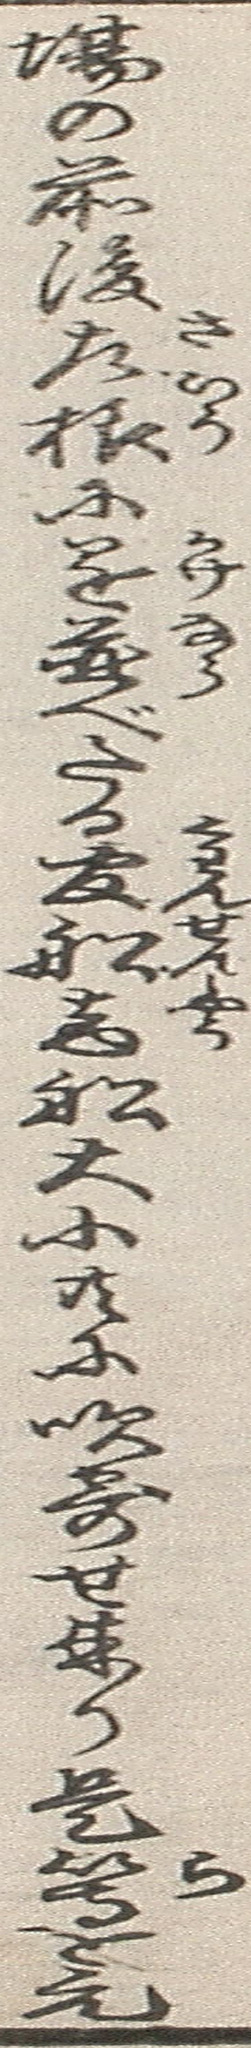場の前後左様に懸並べたる官船商船大小共に吹寄来り是等を元
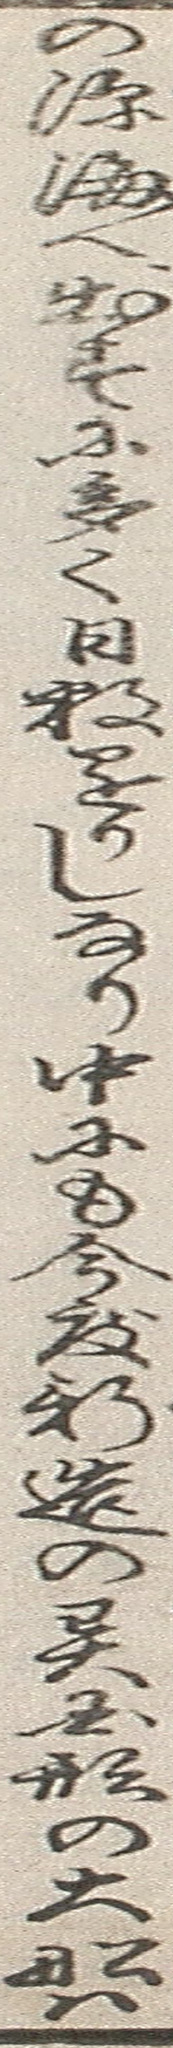の深海へ出すに多く日数懸りしなり中にも今度新造の異国形の大船ハ
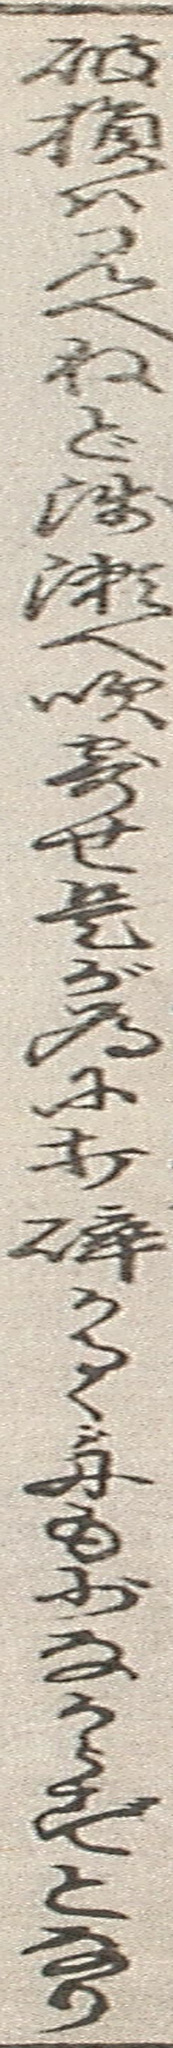破損ハ見へねど浅瀬へ吹寄せ是が為に打碎かるゝ舟も少なからずとなり
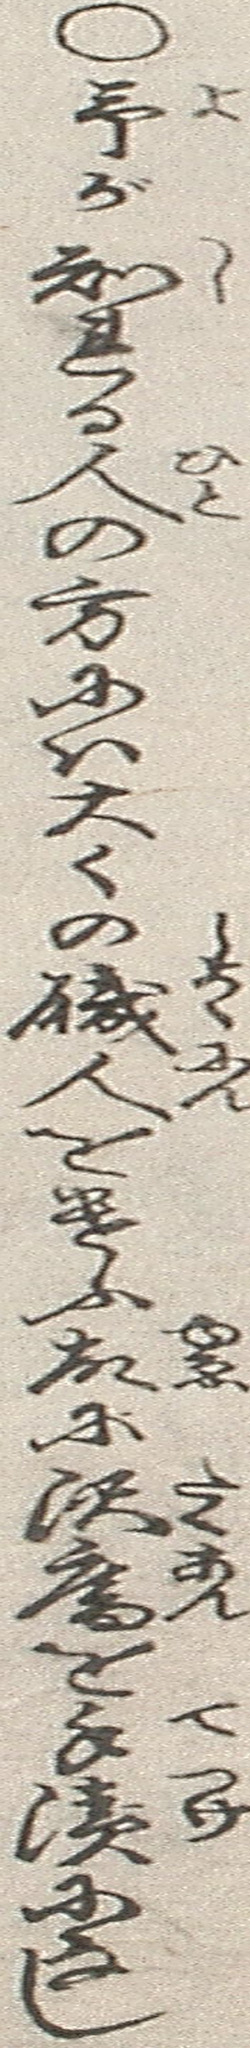◯予が知れる人の方にハ大くの職人を遣ふ故に沢庵を手漬になし
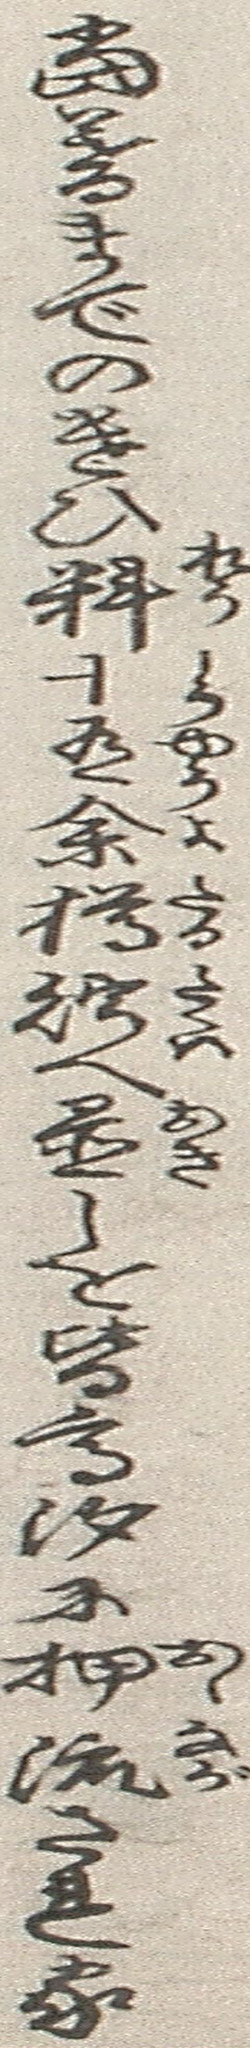当暮までの遣ひ料十有余樽貯へ置おきしを皆高汐に押流され我
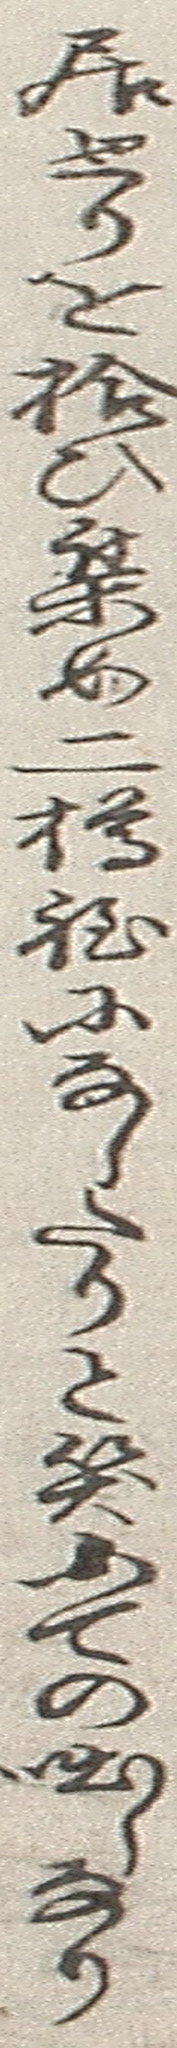居廻りを拾ひ集め二樽程になしたりと笑ふての咄しなり
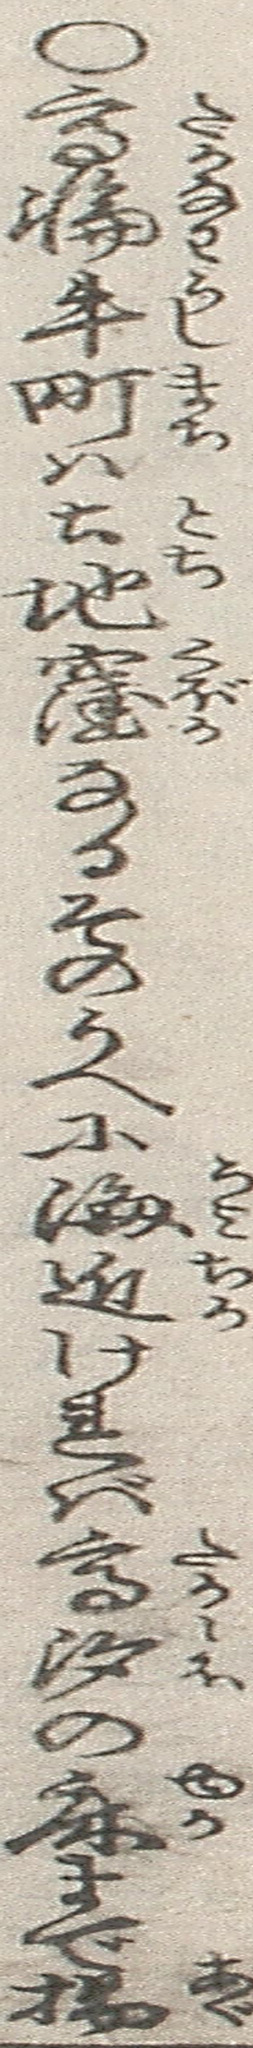◯高輪牛町ハ土地窪なるそのうへに海近けれバ高汐の床まで揚
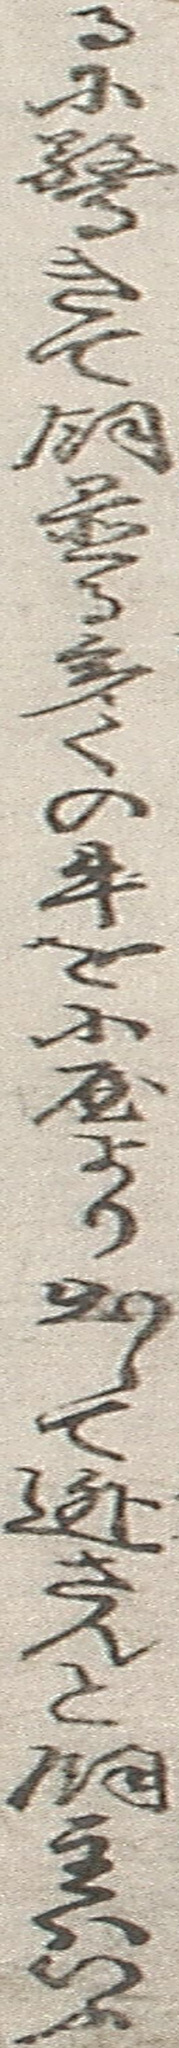るに驚きて飼置たる多くの牛を小屋より出して逃さんと飼主ハいふ
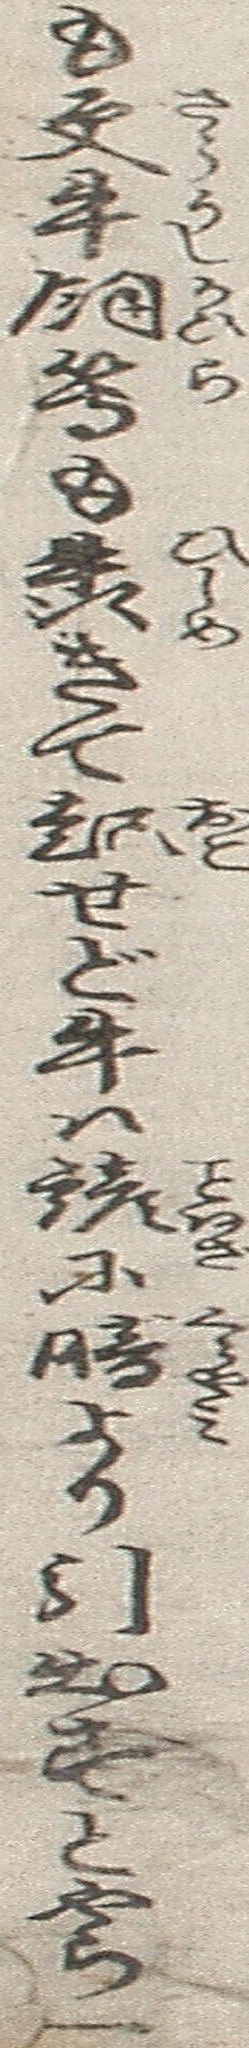も更牛飼等も犇きて起せど牛ハ諺に暗より引出すとやら一
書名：安政風聞集　上中下　全
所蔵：東京大学地震研究所図書室 Earthquake Research Institute Library, The University of Tokyo, JAPAN
